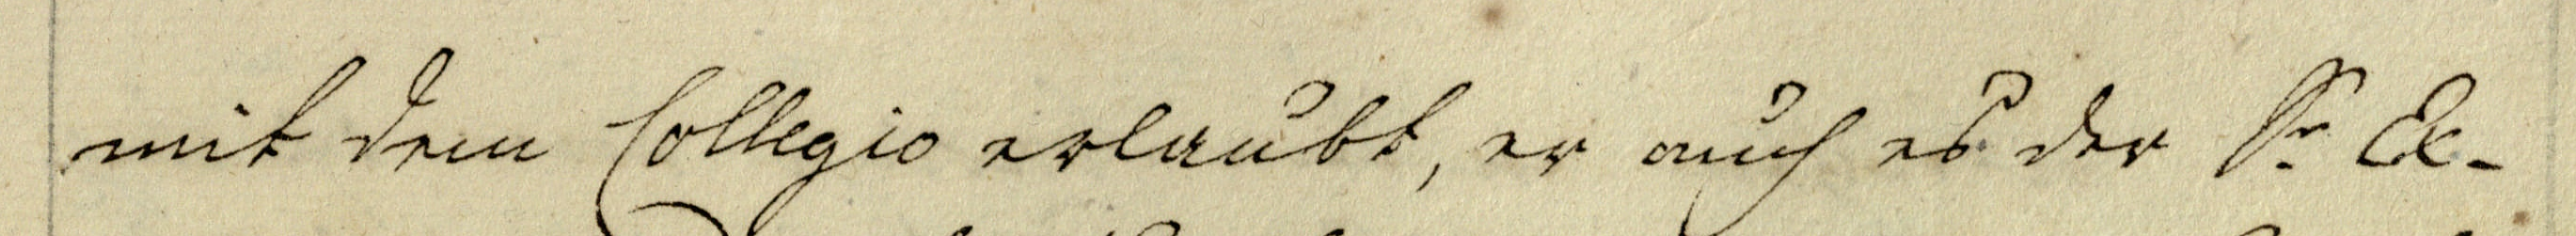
mit dem Collegio erlaubt, er auch es der Sr Ex¬
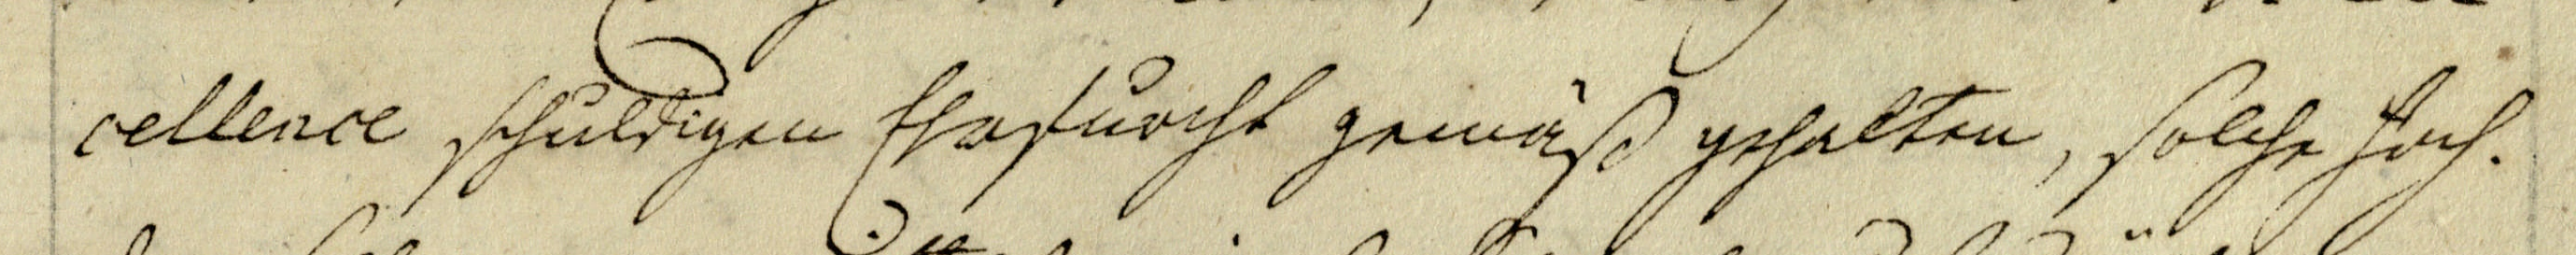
cellence schuldigen Ehrfurcht gemäß gehalten, solche hoch¬
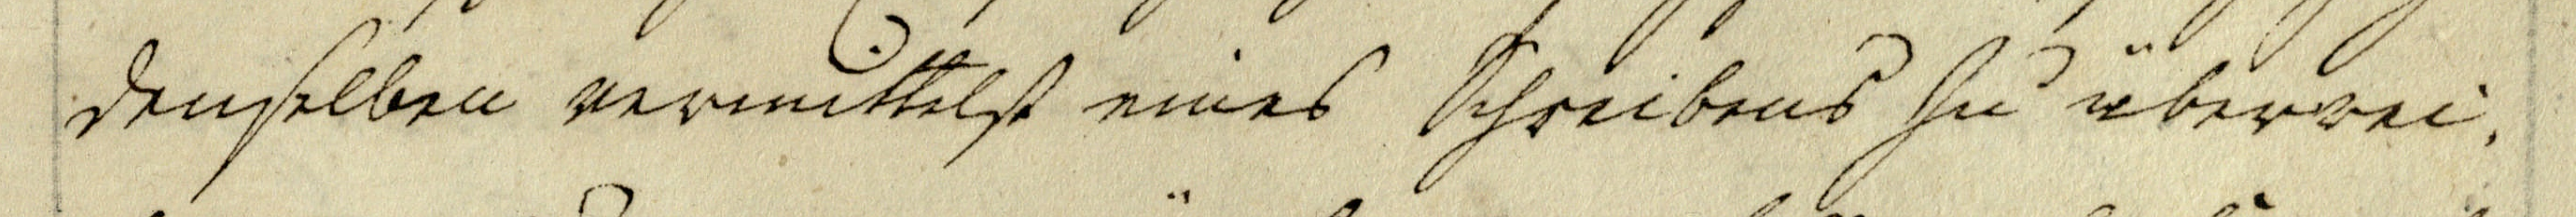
denselben vermittelst eines Schreibens zu überrei¬
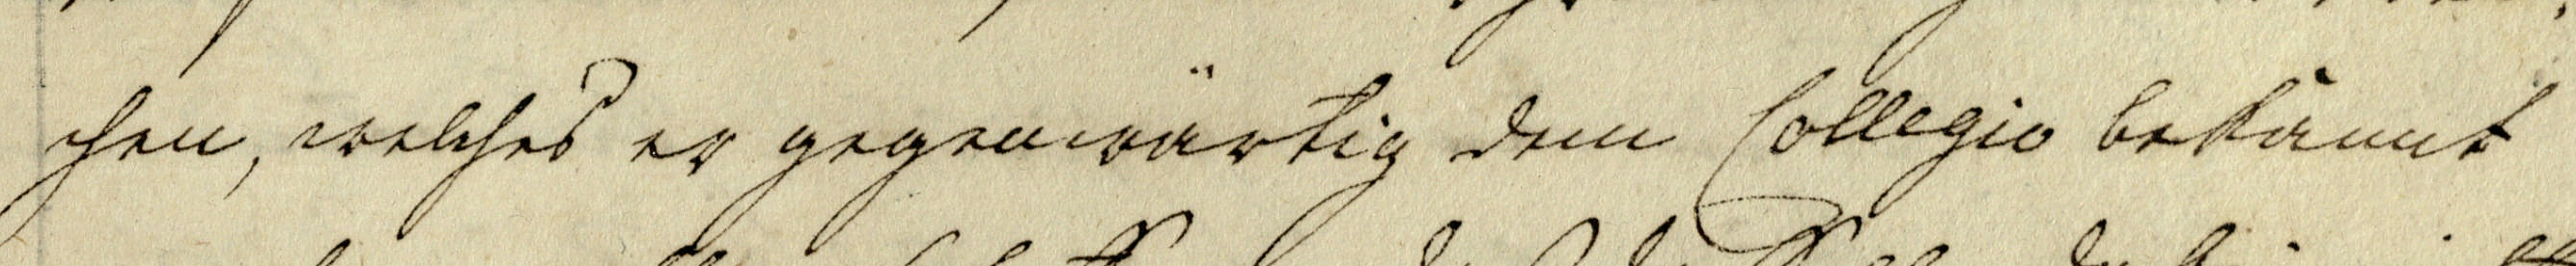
chen, welches er gegenwärtig dem Collegio bekannt
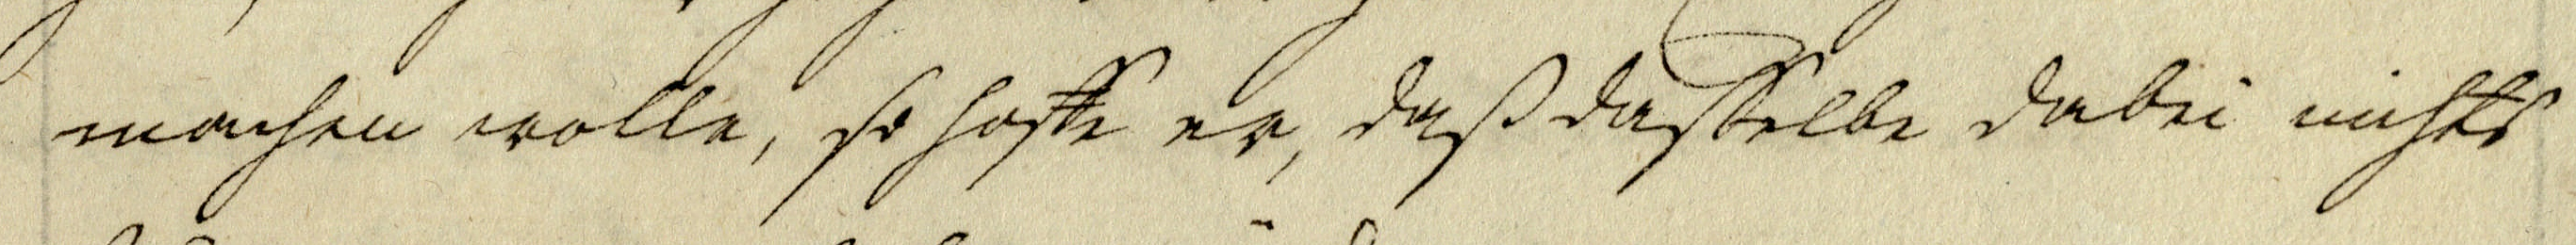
machen wolle, so hoffe er, daß dasselbe dabei nichts
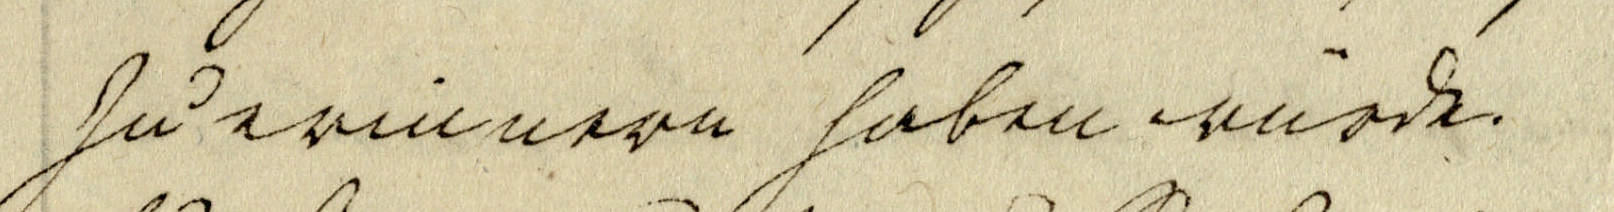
zu erinnern haben würde.
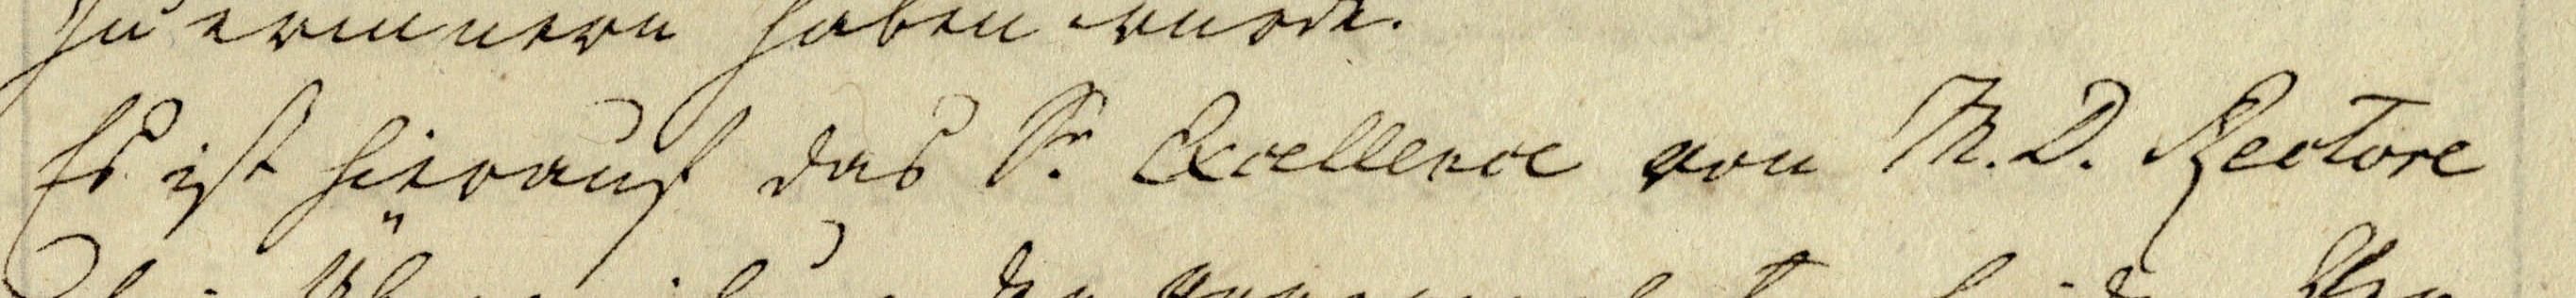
Es ist hierauf das Sr. Excellence von M. D. Rectore
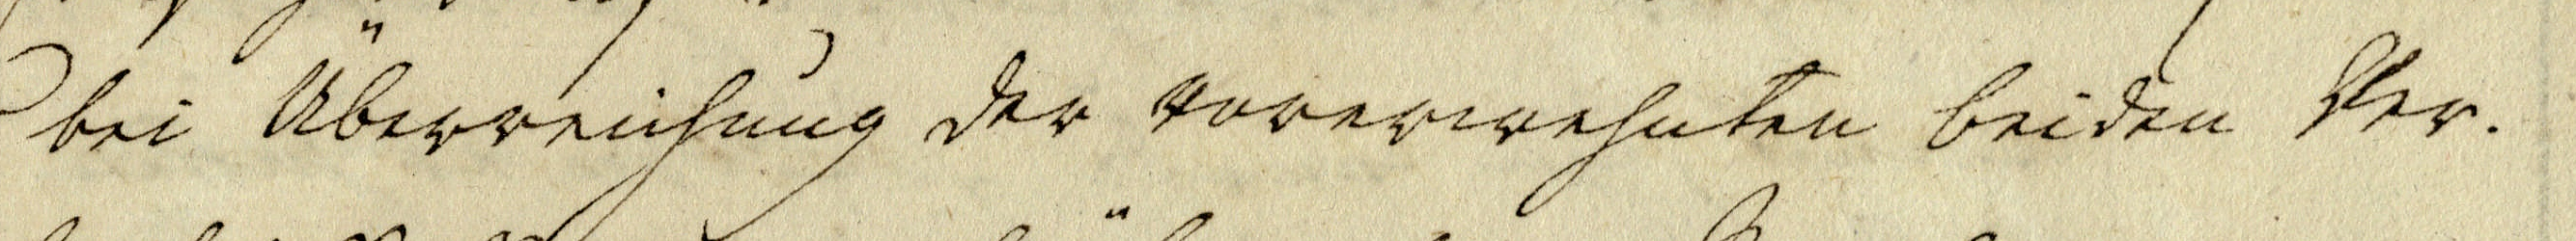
bei Überreichung der vorerwehnten beiden Ver¬
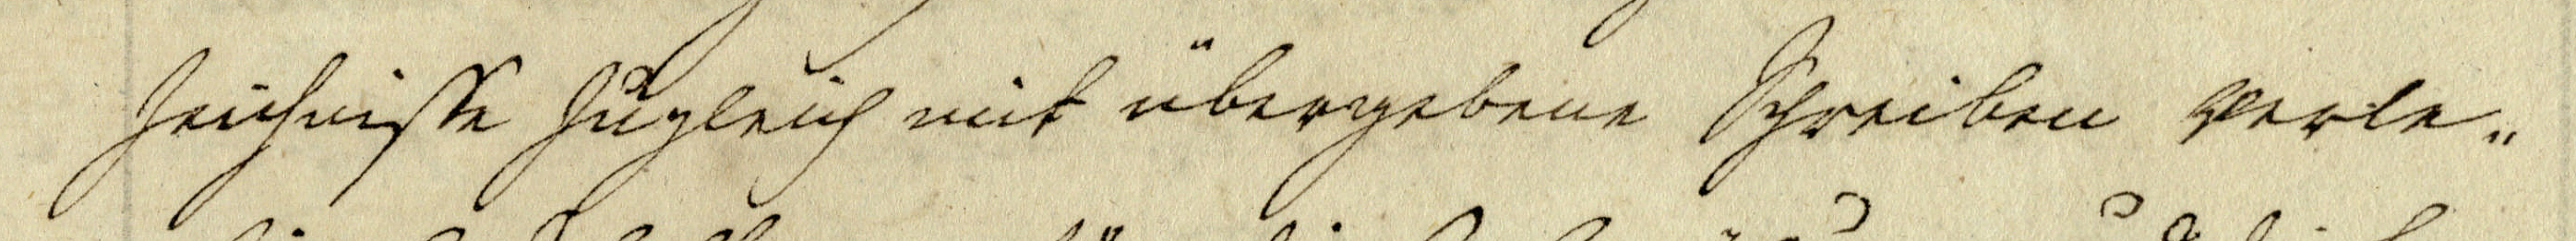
zeichnisse zugleich mit übergebene Schreiben verle¬
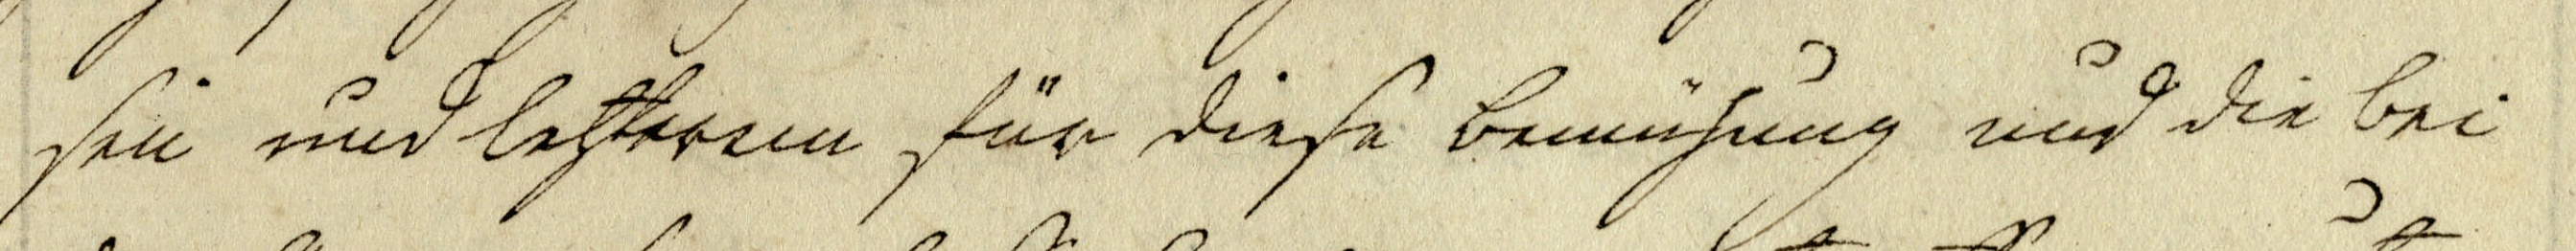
sen und letzterem für diese Bemühung und die bei
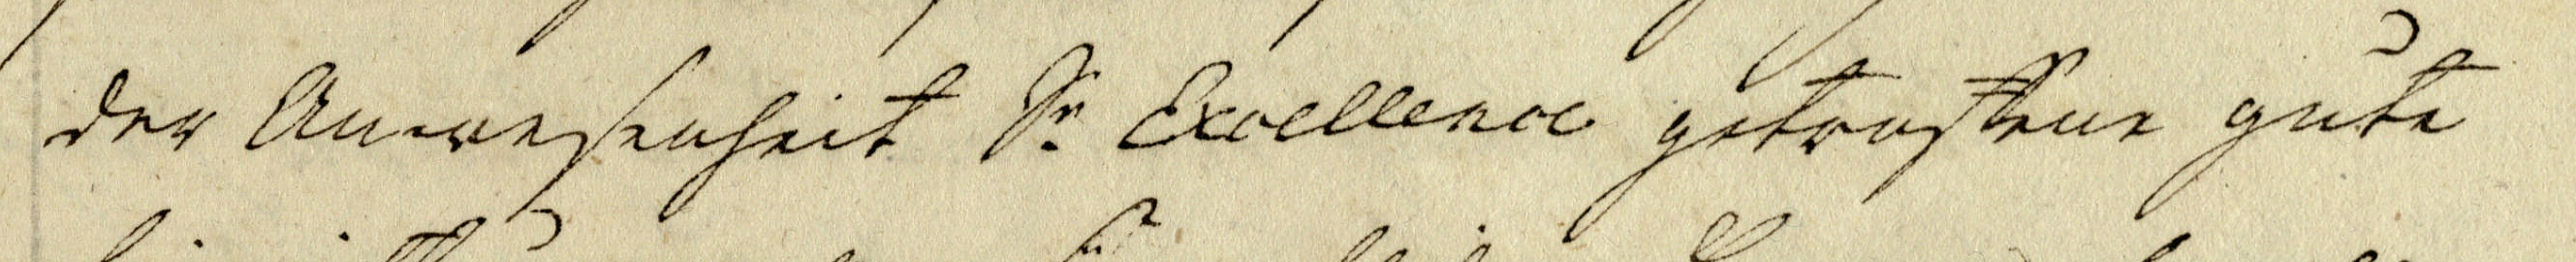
der Anwesenheit Sr Excellence getroffene gute
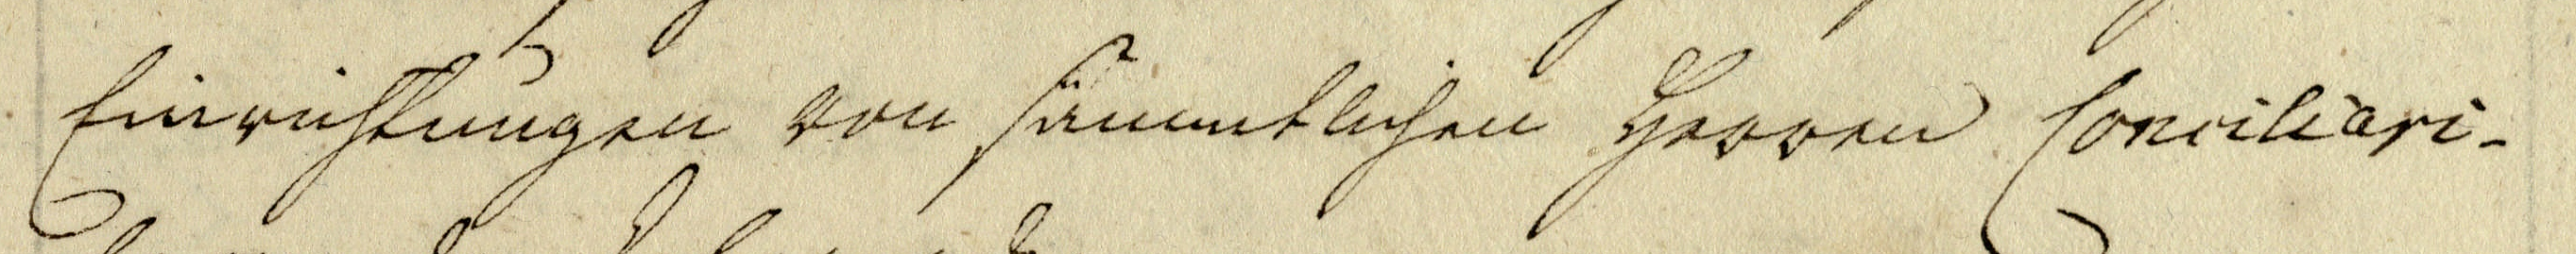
Einrichtungen von sämmtlichen Herren Conciliari¬
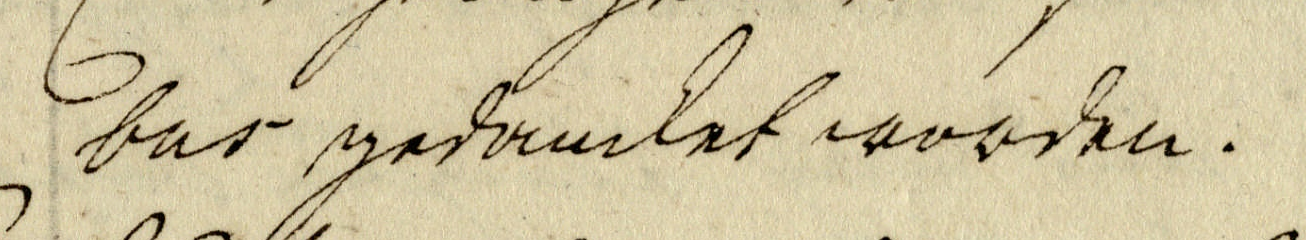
bus gedancket worden.
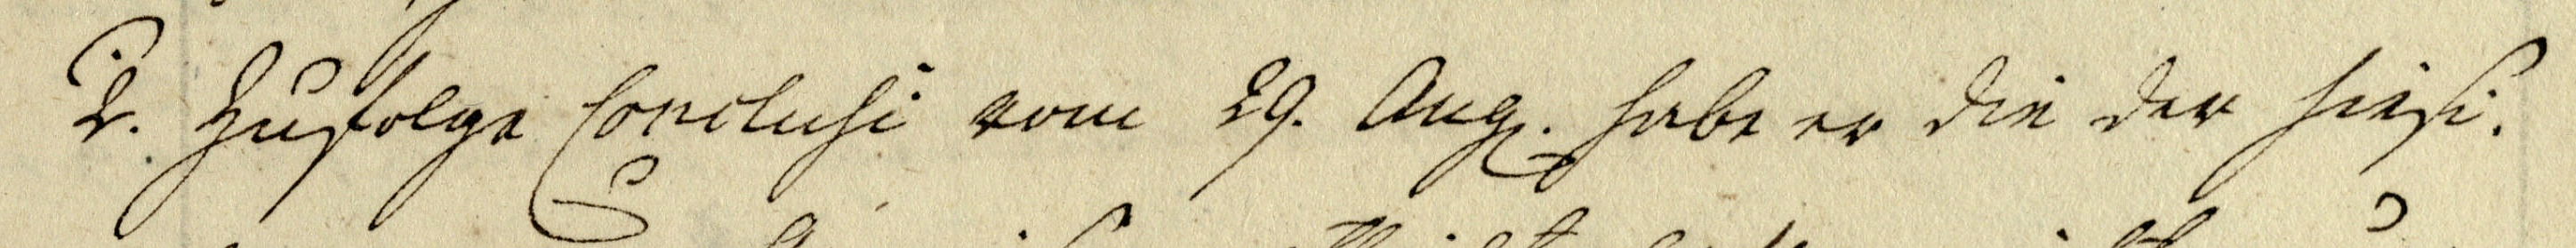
2. Zufolge Conclusi vom 29. Aug. habe er die der hiesi¬
